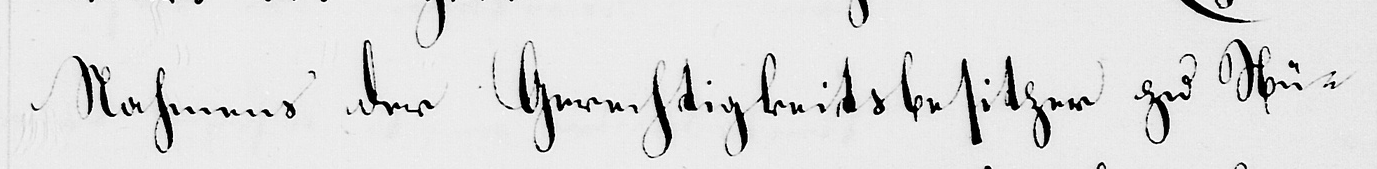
Nahmens der Gerechtigkeitsbesitzer zu Nü¬
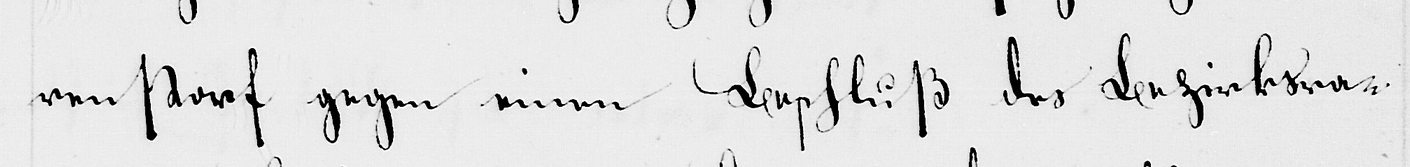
renstorf gegen einen Beschluß des Bezirksra¬
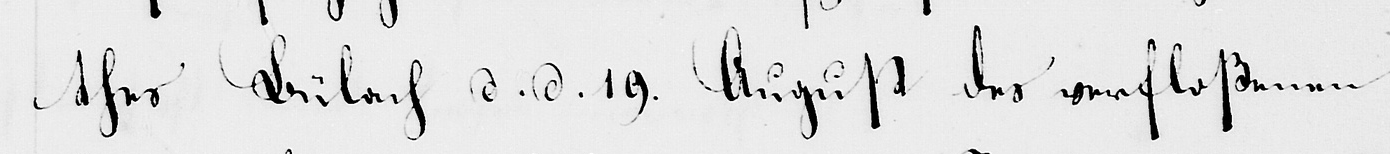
thes Bülach d. d. 19. August des verfloßenen
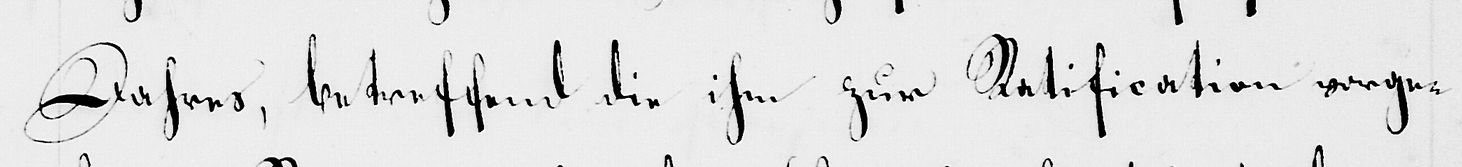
Jahres, betreffend die ihm zur Ratification ange¬
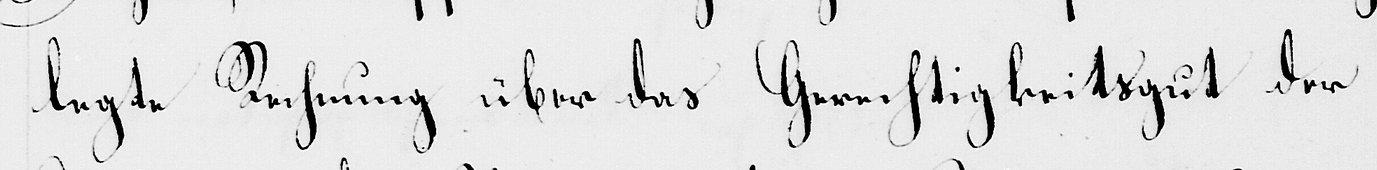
legte Rechnung über das Gerechtigkeitsgut der
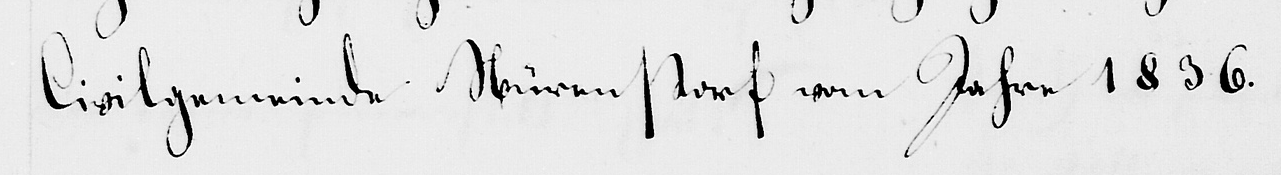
Civilgemeinde Nürenstorf vom Jahre 1836.
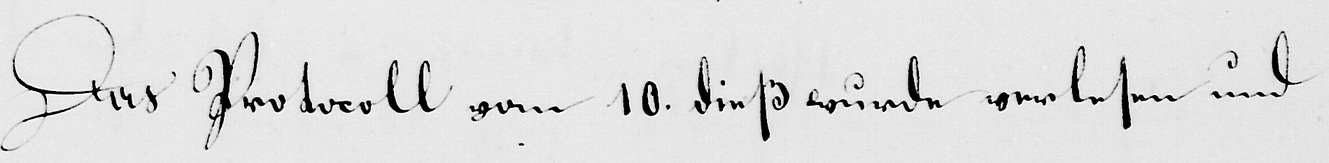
Das Protocoll vom 10. dieß wurde verlesen und
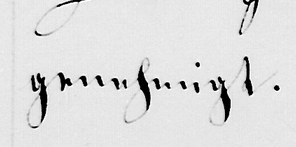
genehmigt.
